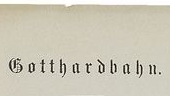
Gotthardbahn.
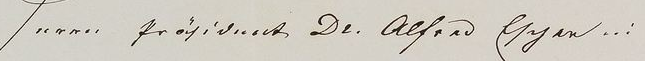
Herrn Präsident Dr. Alfred Escher in
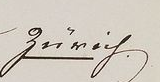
Zürich.
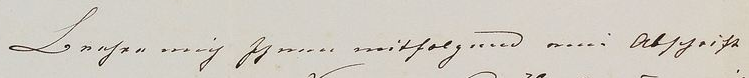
Beehre mich Ihnen mitfolgend eine Abschrift
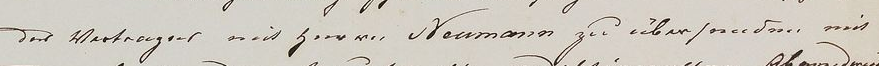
des Vertrages mit Herrn Neumann zu übersenden mit
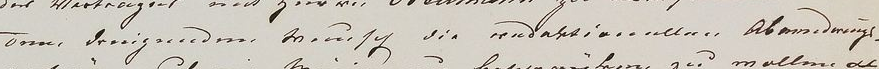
dem dringenden Wunsch die redaktionellen Abaenderungs-
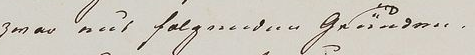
zwar aus folgenden Gründen.
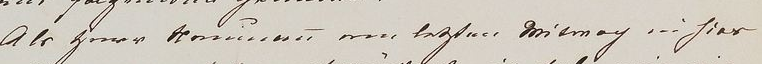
Als Herr Neumann am lezten Mitwoch in hier
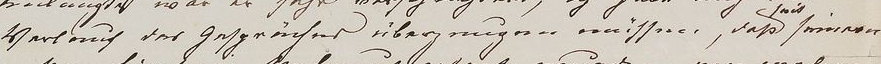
Verlauf des Gespräches überzeugen müssen, daß seit seinem
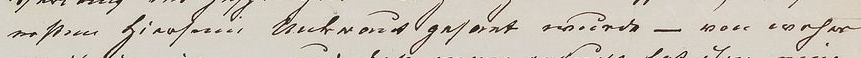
ersten Hiersein Unkraut gesaet wurde – von woher
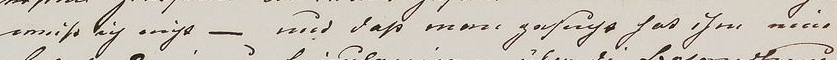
weiß ich nicht – und daß man gesucht hat ihm eine
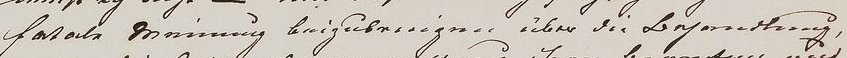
fatale Meinung beizubringen über die Behandlung,
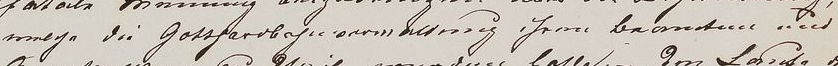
welche die Gotthardbahnverwaltung ihren Beamten und
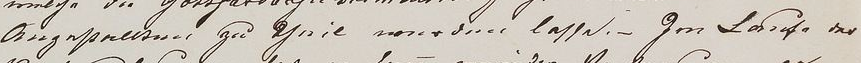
Angestellten zu theil werden lasse. – Im Laufe der
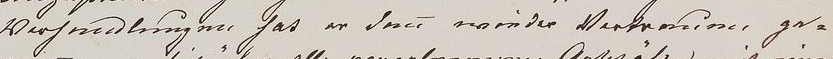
Verhandlungen hat er dann wieder Vertrauen ge-
